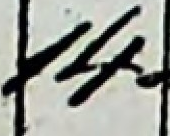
14
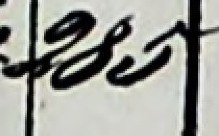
285
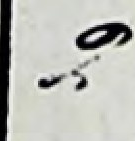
2
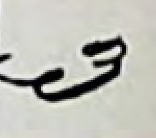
3
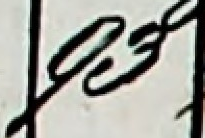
93
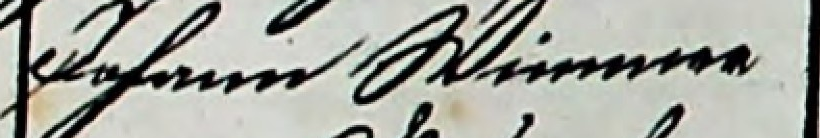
Johann Wimmer
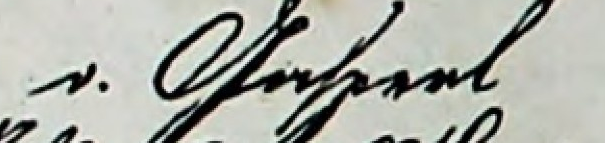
v. Gasperl
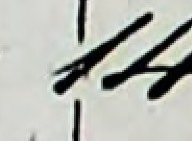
14
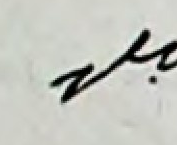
do
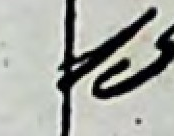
15
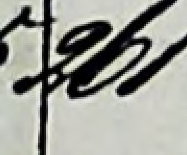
261
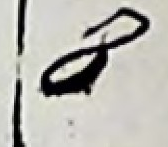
8
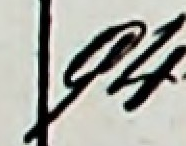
94
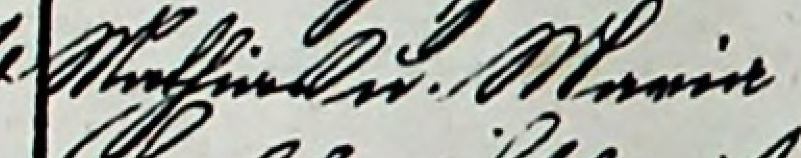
Mathias u. Maria
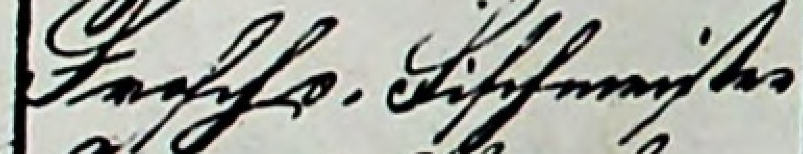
Frosch v. Fischmeister
